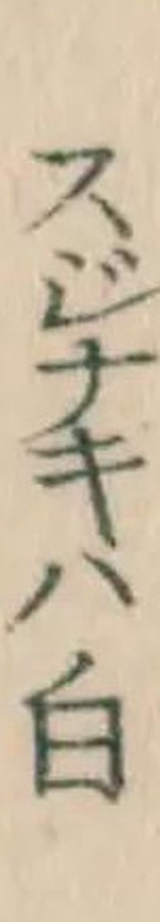スジナキハ白

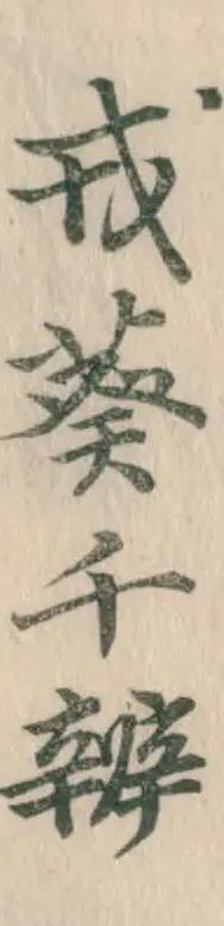戎葵千弁

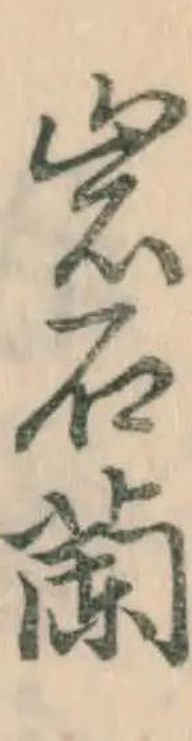岩石蘭
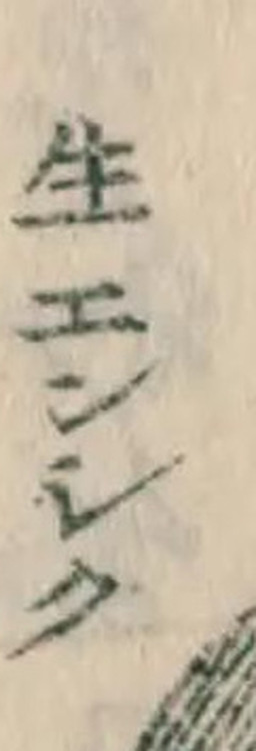生エンシク

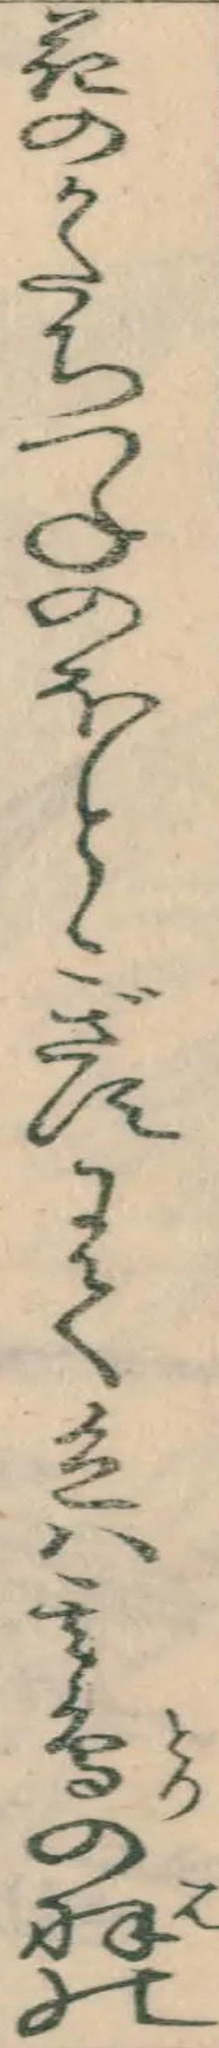花のかたちつねのほとゝぎすにて色は其鳥の羽の
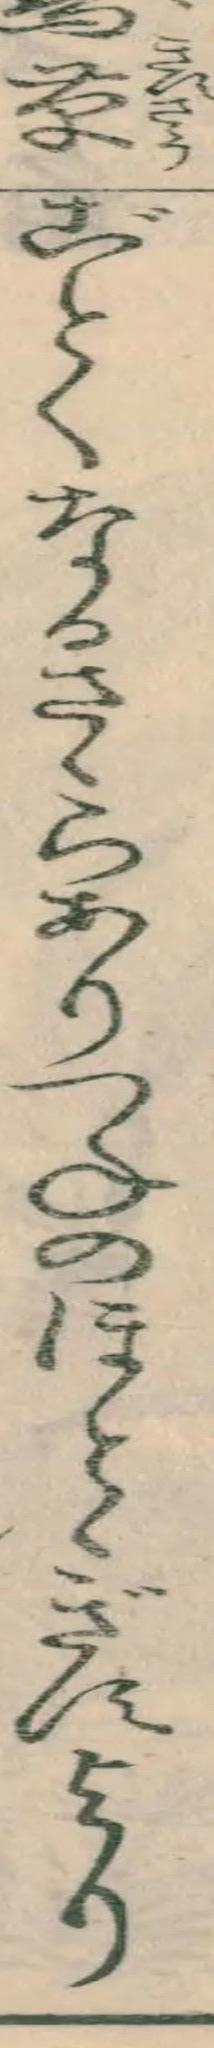ごとくなるさゝらありつねのほとゝぎすより
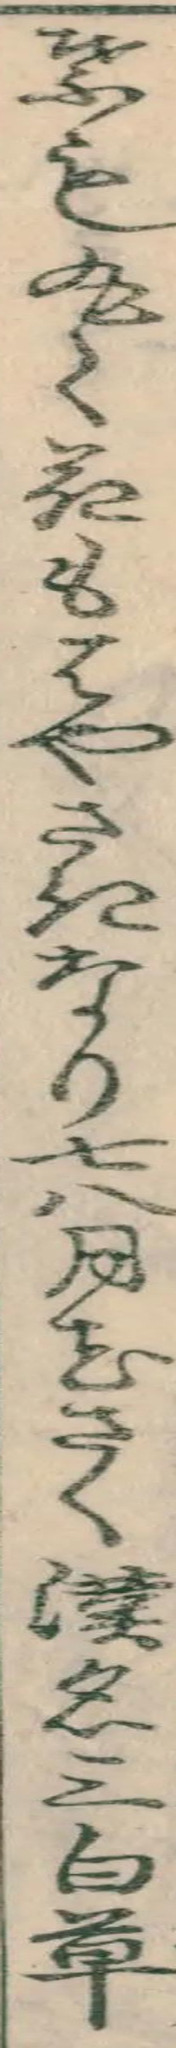葉も丸く花もはやさきなり七八月花さく漢名三白草
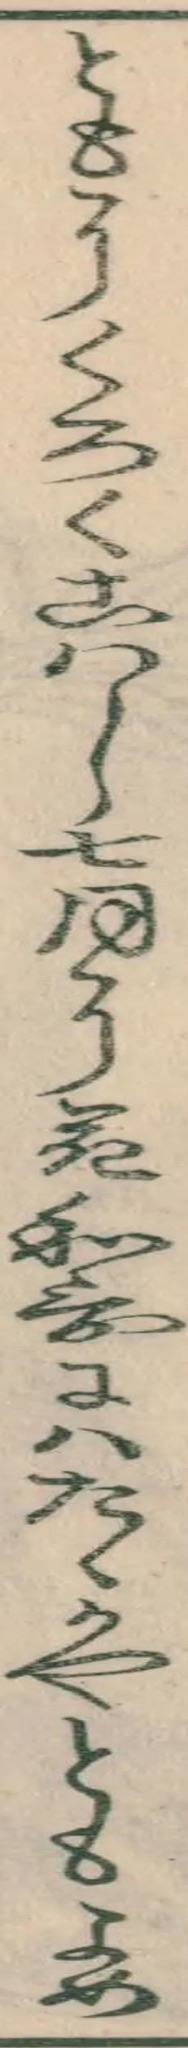ともにくろくこはし七月に花和哥にはたゝかやともよめ
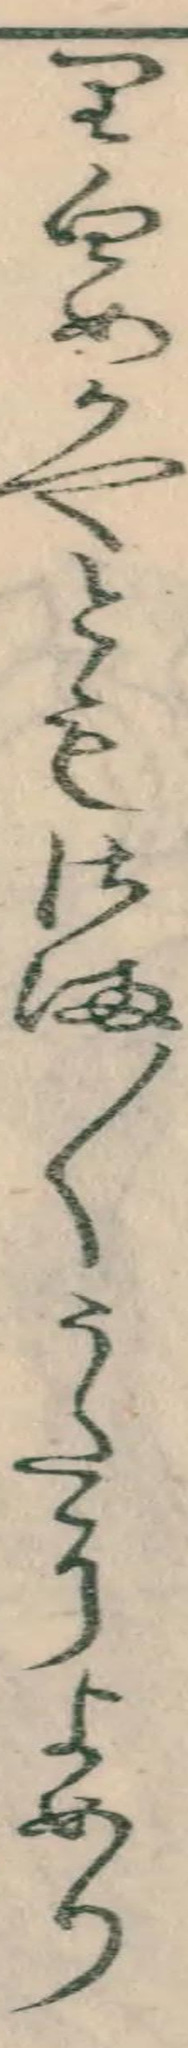り白めかやともさま〳〵うたによめり
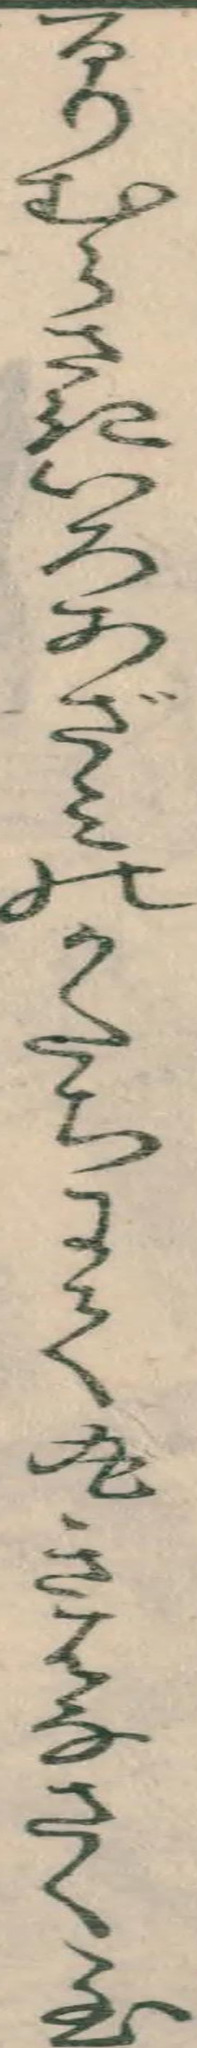るりむらさきいろあざみのかたちにて丸きはなさく至
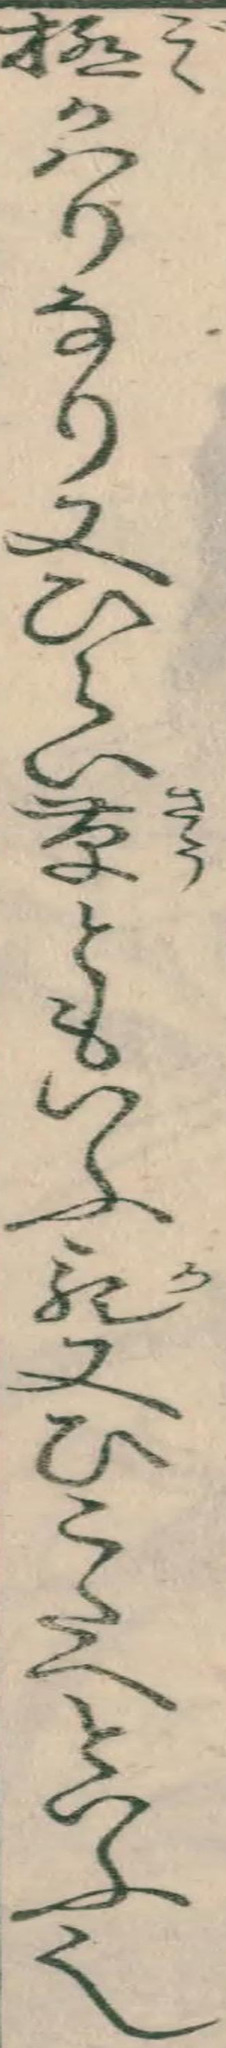極かはりなり又ひらい草ともいふ歟又ひこたへといふ也
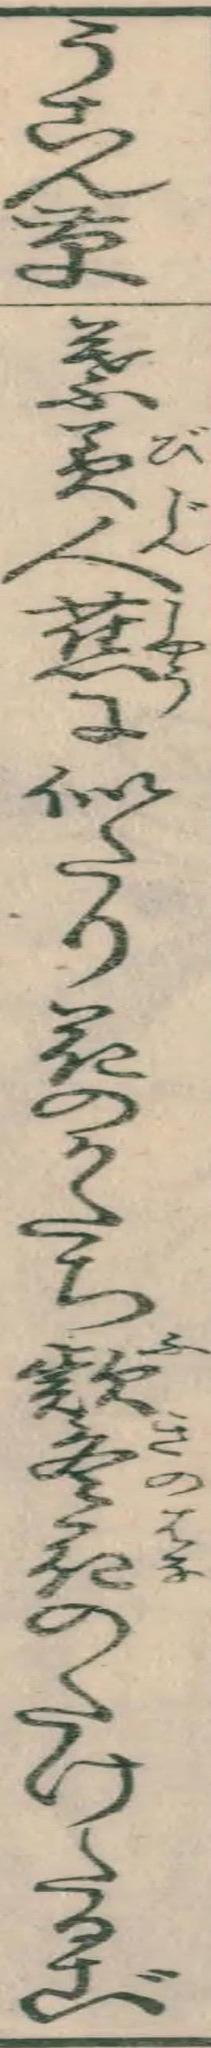葉美人蕉に似たり花のかたち歎冬花のたけたるご
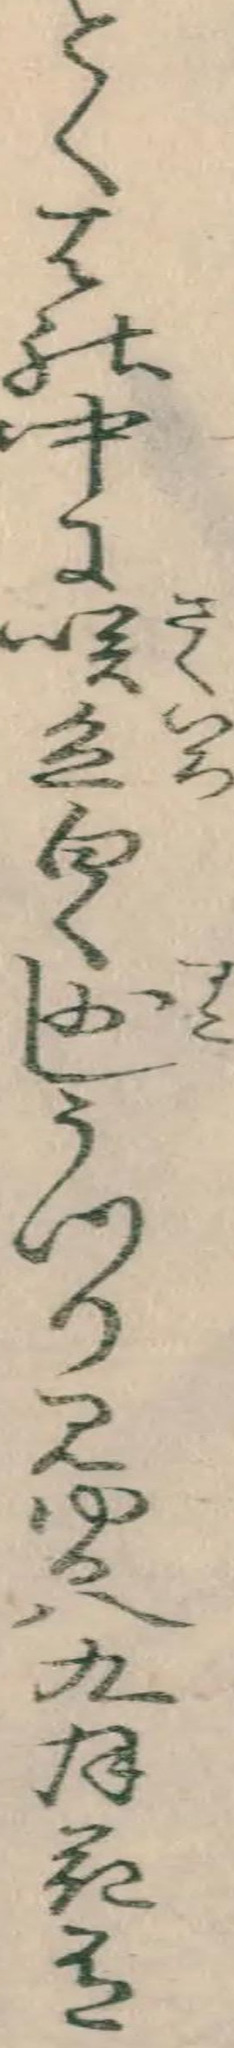とくはの中に咲色白く少しうつり見ゆる八九月花有
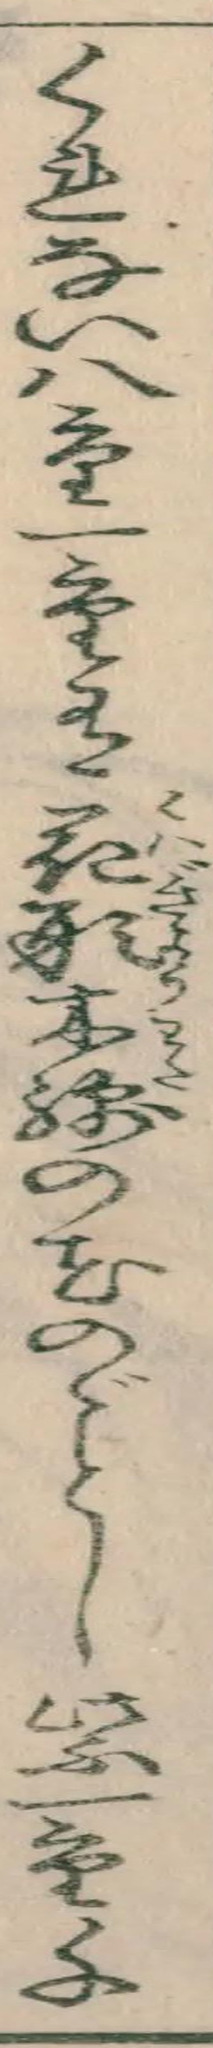くれない八重一重有花形木綿の花のごとし紫一重千
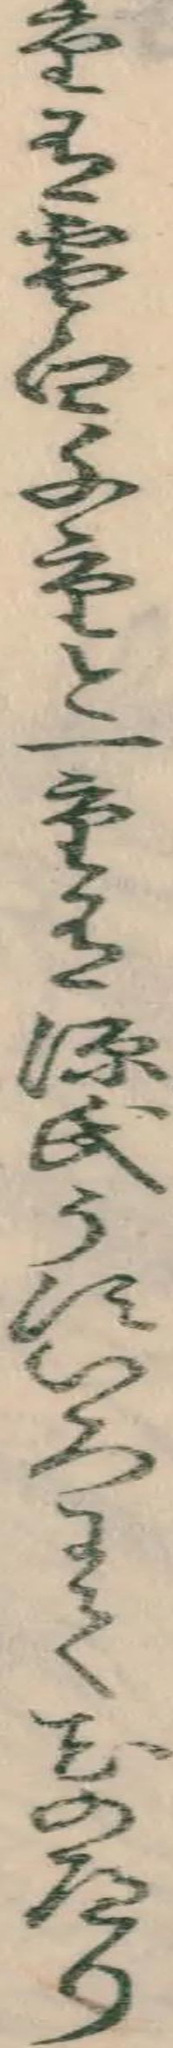重有雪白千重と一重有源氏うすいろにて花のへり
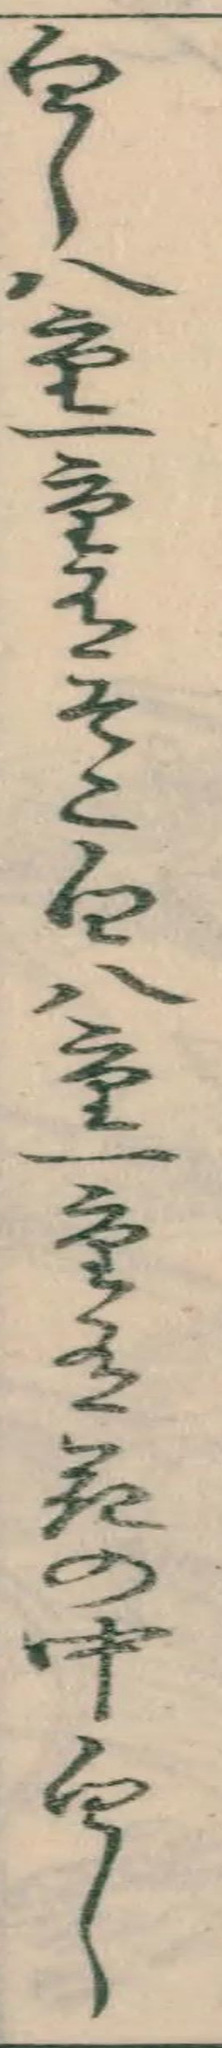白し八重一重有そこ白八重一重有花の中白し
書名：畫本野山草. [1]
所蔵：国立国会図書館 National Diet Library, JAPAN
